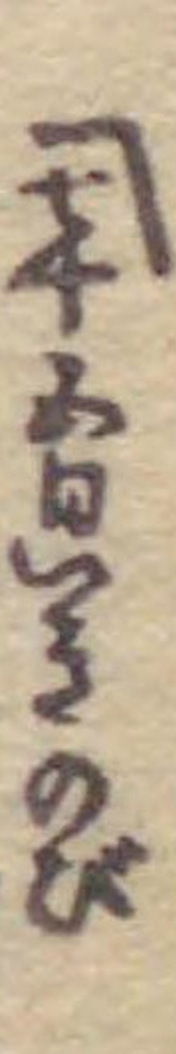〽七十五日いきのび
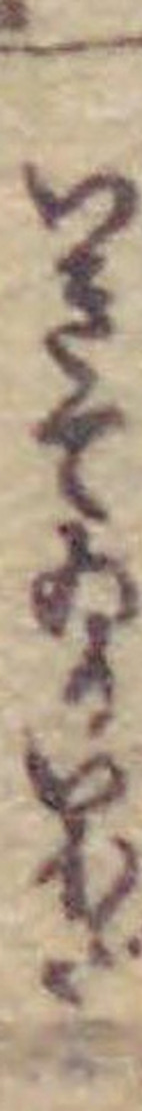いきてゐるいほだ
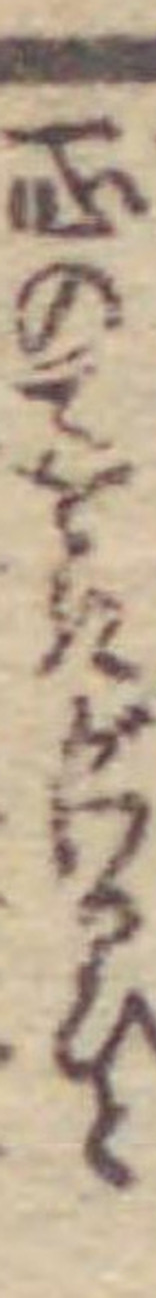一心のてをきがわるひと
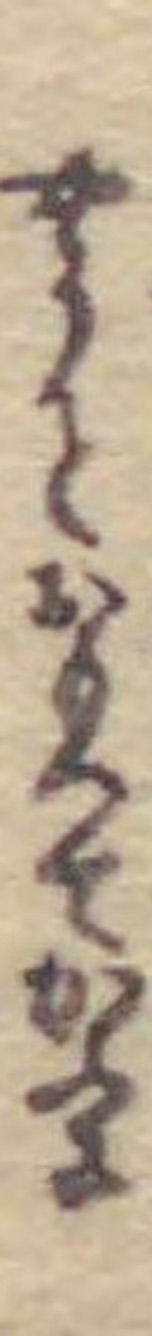やうとおもつてかふに
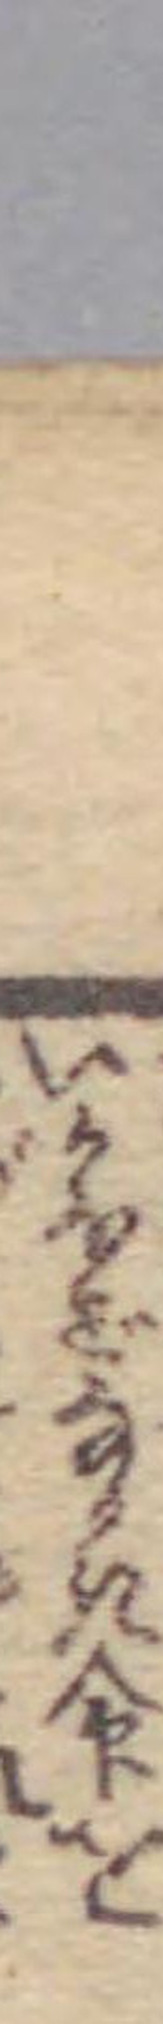いかほどなかき命を
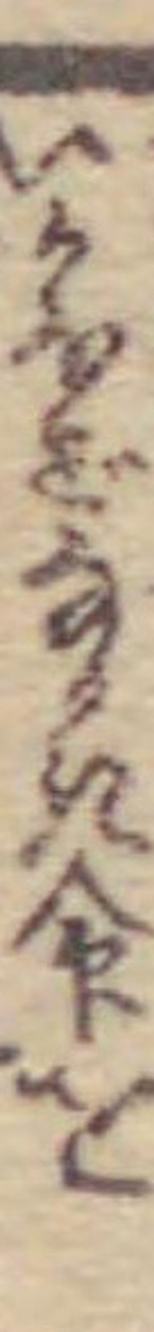いかほどなかき命を
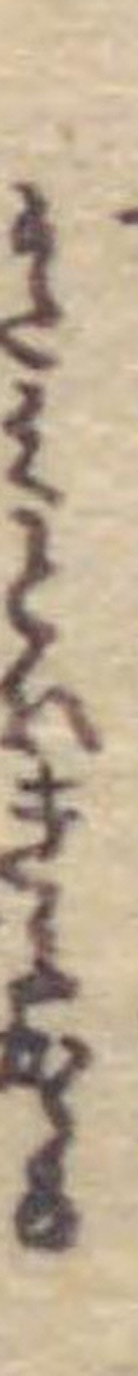かたみとはきにかゝる
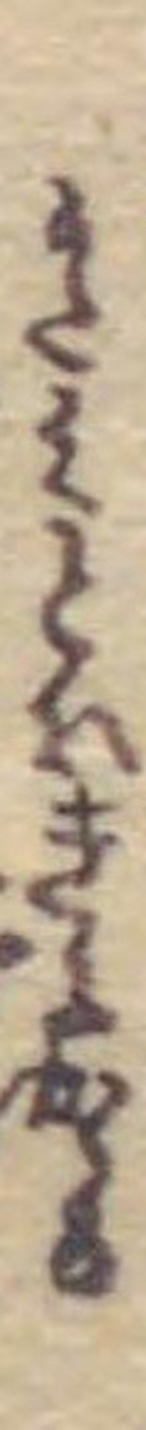かたみとはきにかゝる
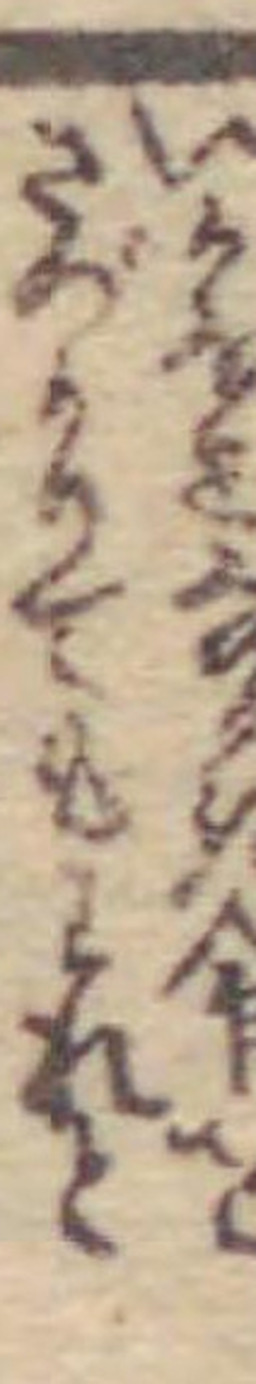さづかりてもわれと
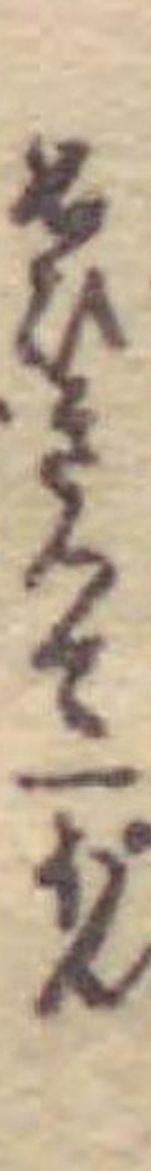思ひきつて一ぽん
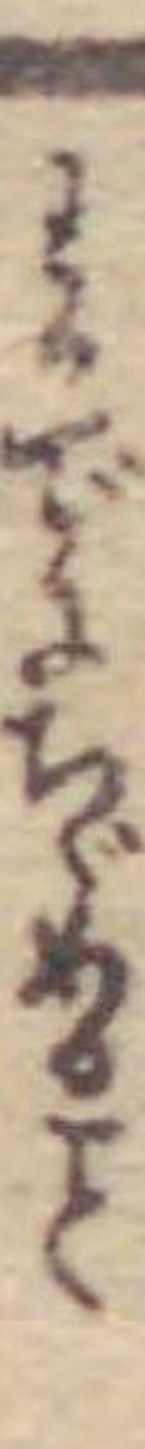わかでにちゞめること
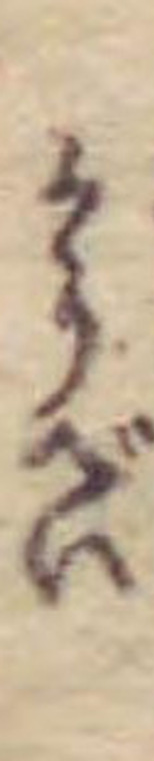かうべい
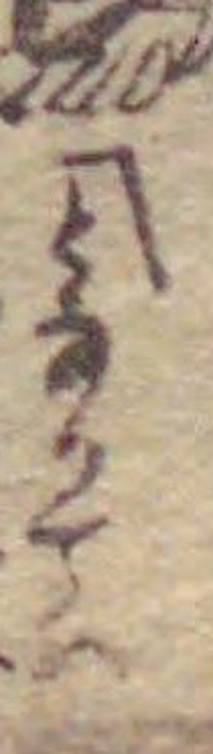〽となりては
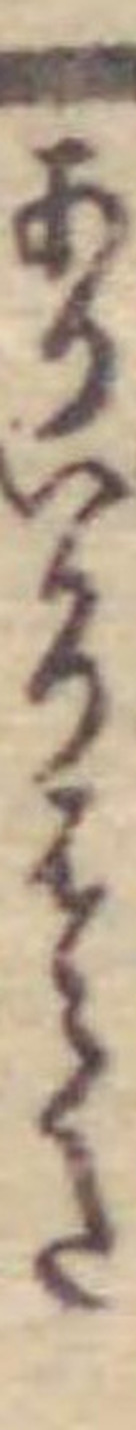ありいかりはらた
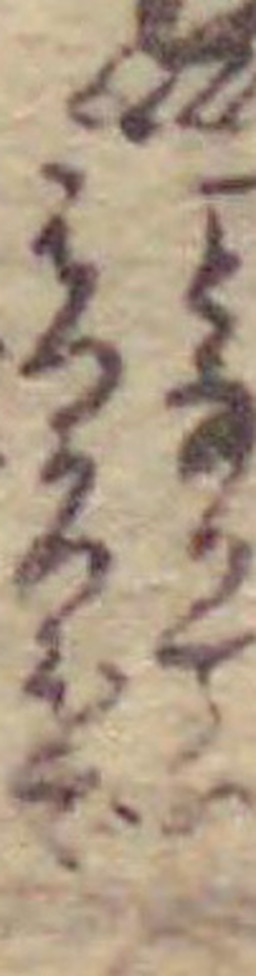はつかつほで
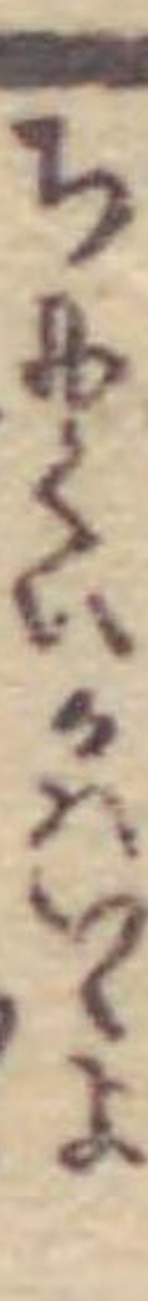ちゆくいかはいゝよ
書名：御誂染長寿小紋 : 3巻
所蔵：国立国会図書館 National Diet Library, JAPAN
